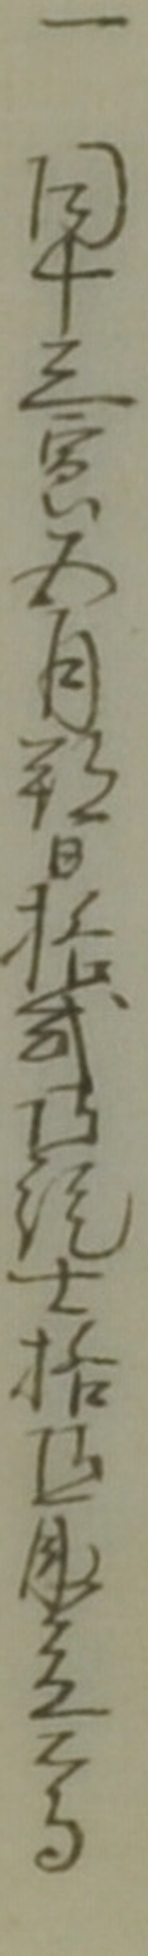一同十三寅五月朔日格式御徒士格御取立高
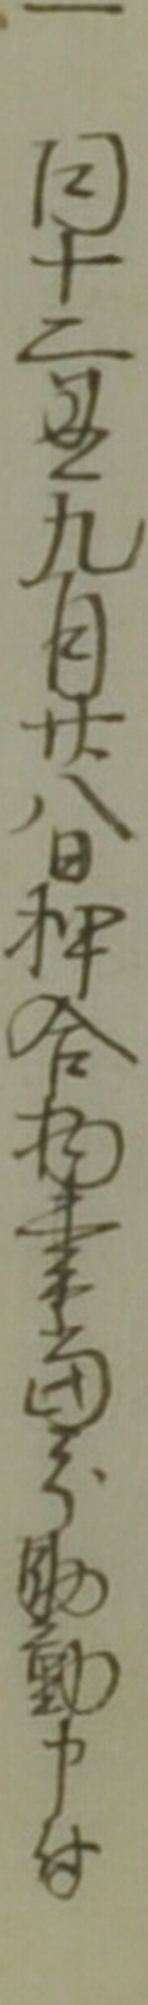一同十二丑九月廿八日押合物書当分助勤申付
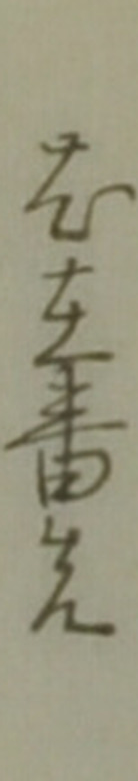尤在番先
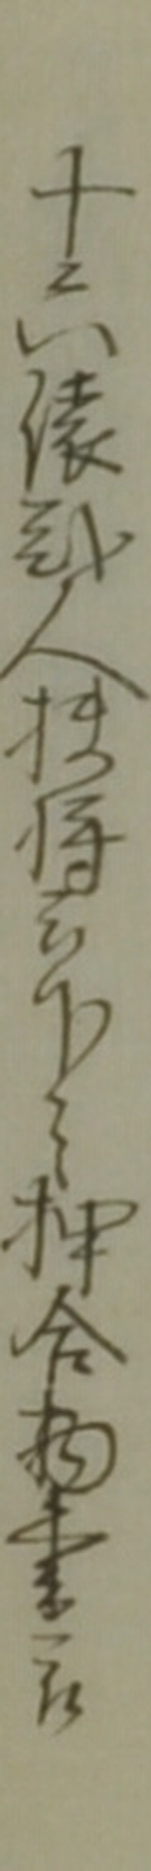十六俵弐人扶持被下之押合物書被
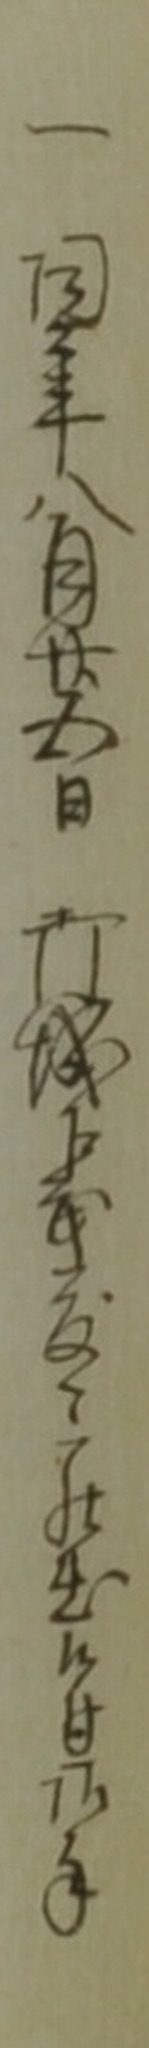一同年八月廿五日御城江茂度々罷出候付御手
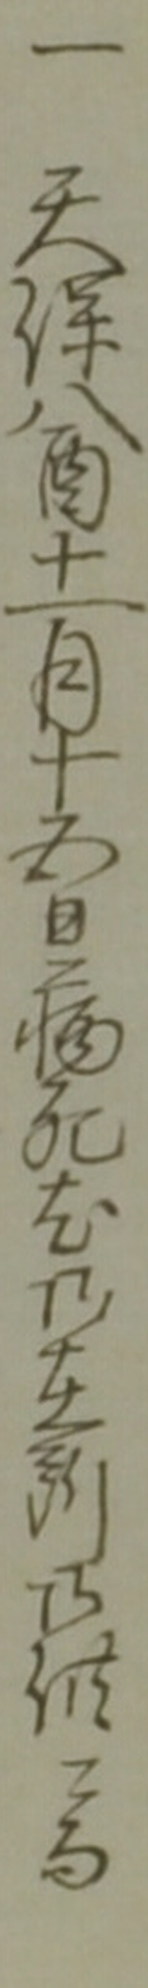一天保八酉十一月十五日病死尤御在所御供ニ而
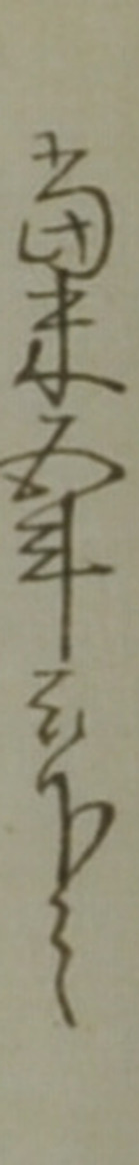当米五斗被下之
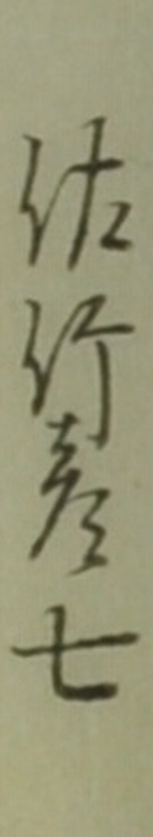佐竹彦七

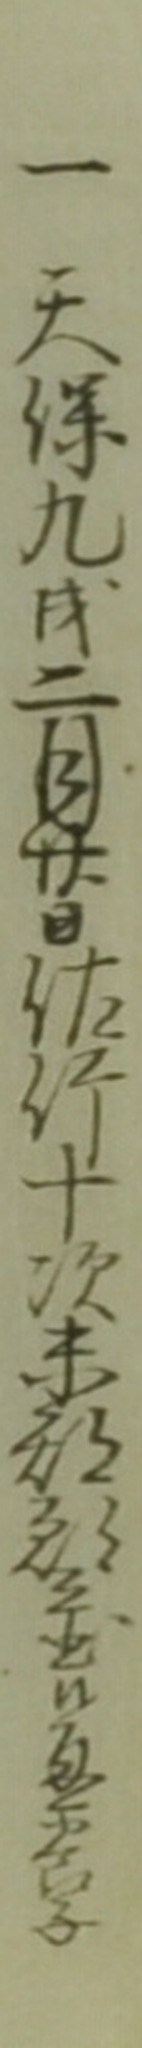一天保九戌二月廿日佐竹十次末期願置候通養子
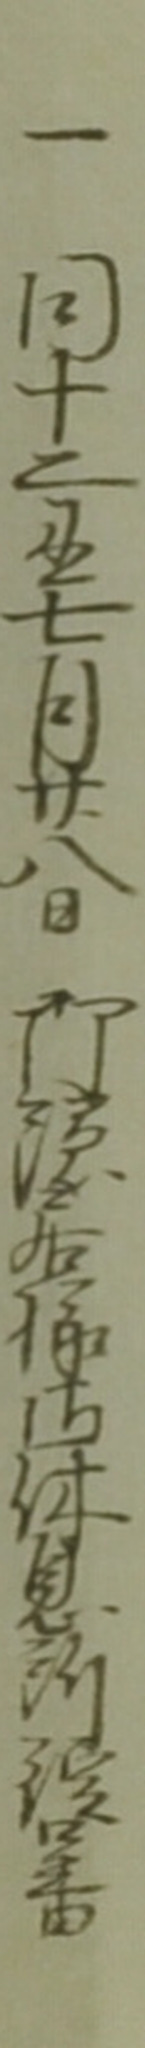一同十二丑七月廿八日御隠居様御休息所錠口番
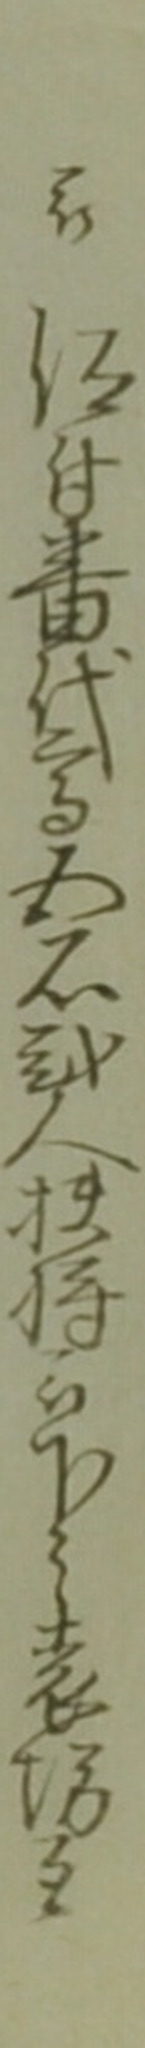被仰付番代高五石弐人扶持被下之表坊主
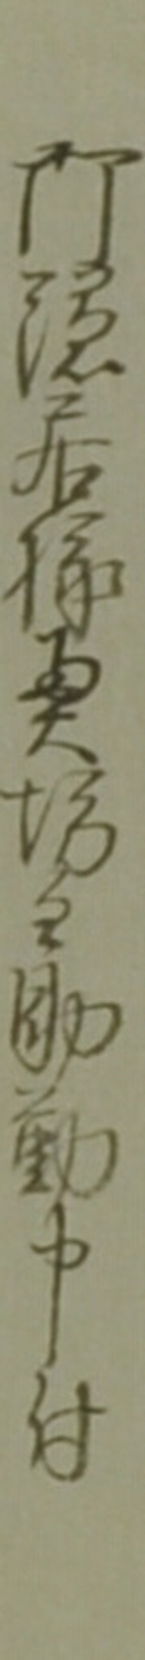御隠居様奥坊主助勤申付
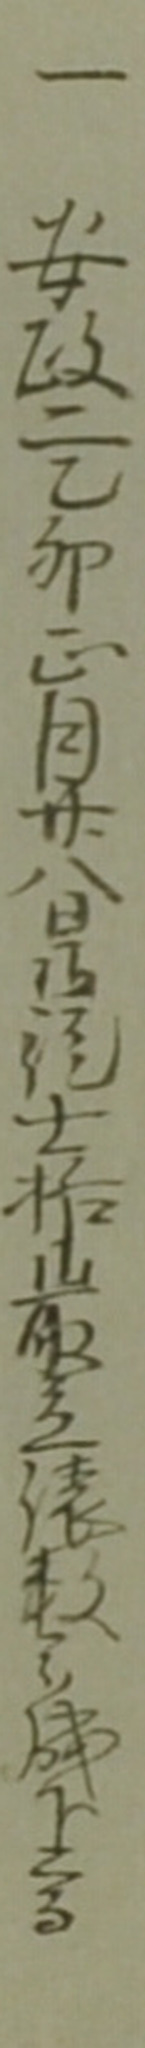一安政二乙卯正月廿八日御徒士格御取立俵数被成下高
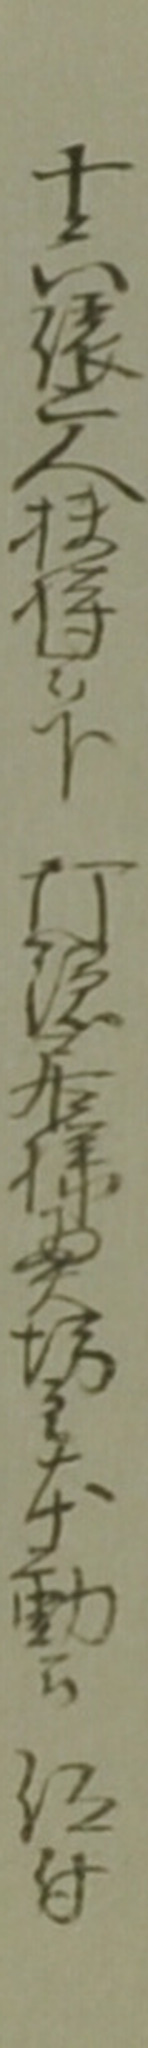十六俵二人扶持被下御隠居様奥坊主本勤被仰付

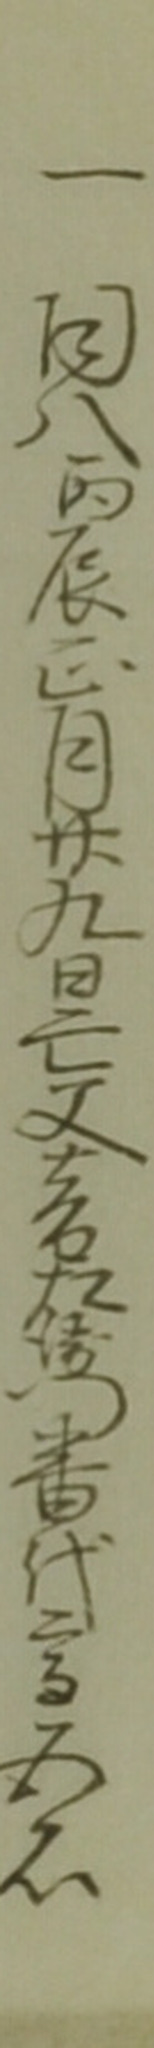一同八丙辰正月廿九日亡父音左衛門番代高五石
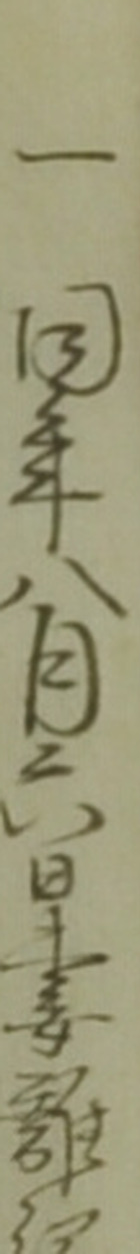一同年八月六日妻離縁
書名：無足諸士勤仕録（九）
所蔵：伊那市立高遠町図書館・合同会社AMANE
